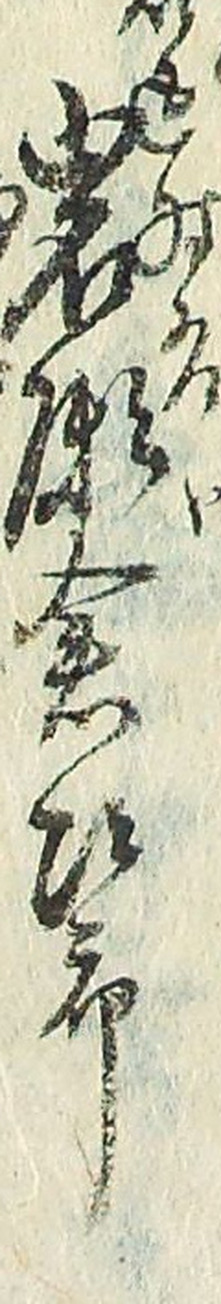岩瀬倉次郎
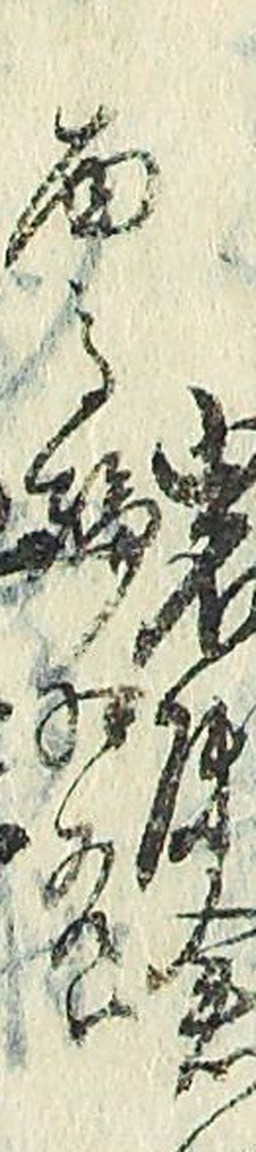西高輪村右同
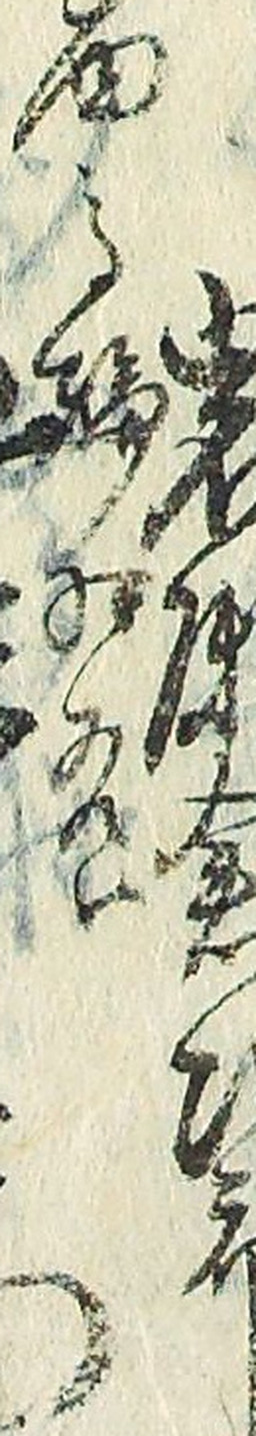西高輪村右同
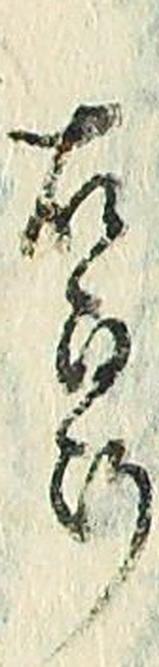右同断
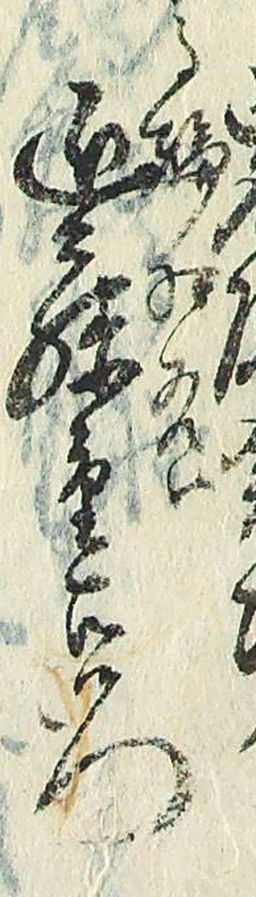近藤金右衛門
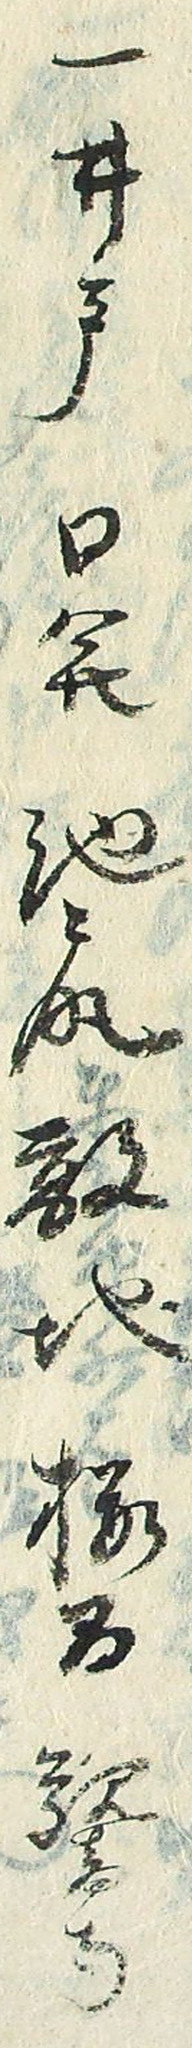一井戸日開池尻敷地桜間観音寺
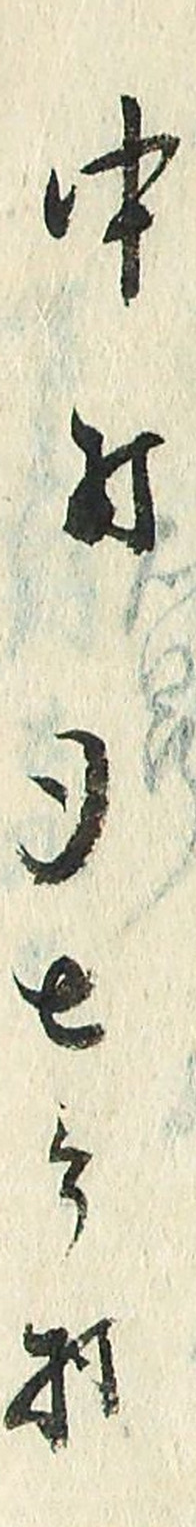中村〆七ケ村

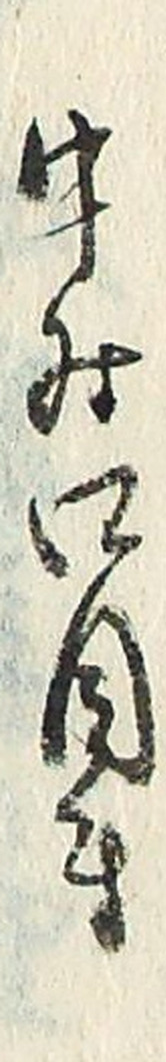中村郷目付
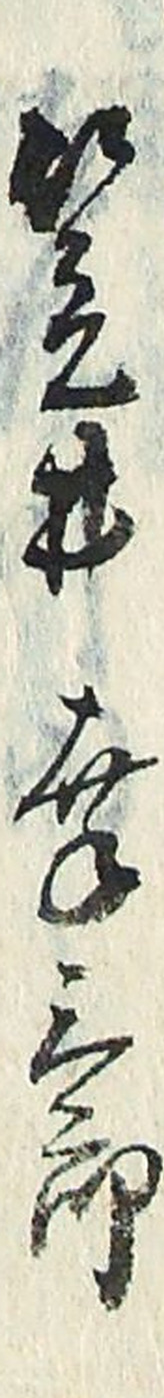笠井幸三郎
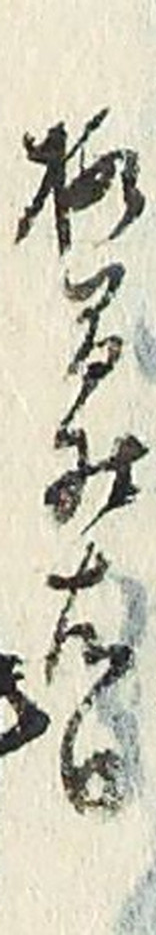桜間村右同
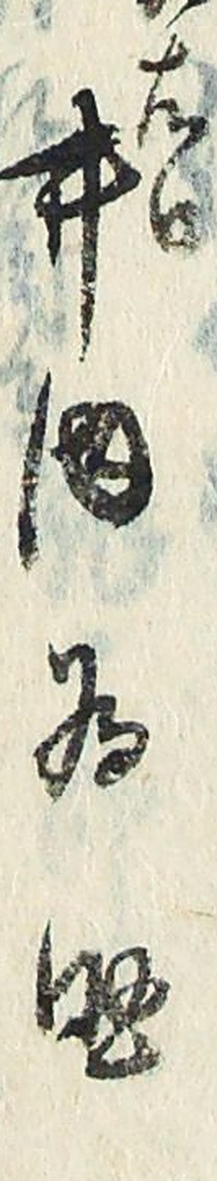井内為助
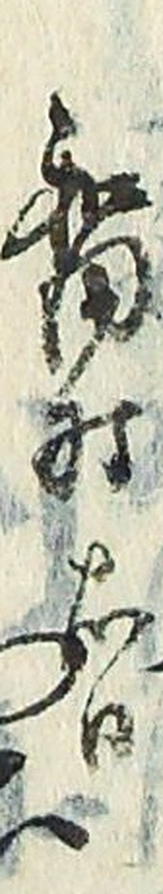和田村右同
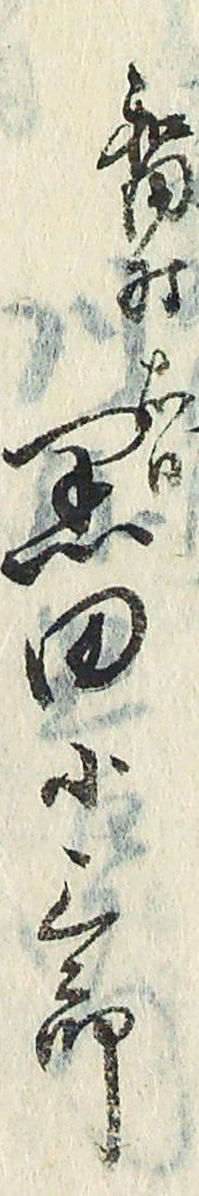黒田小三郎
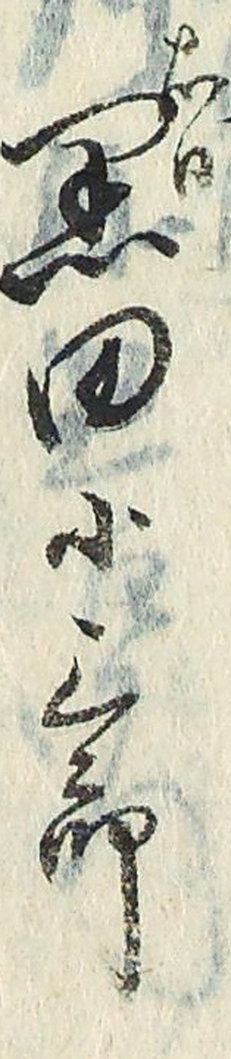黒田小三郎
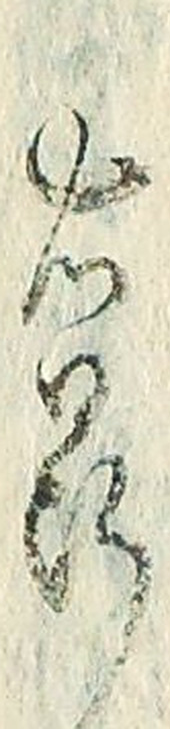右同断
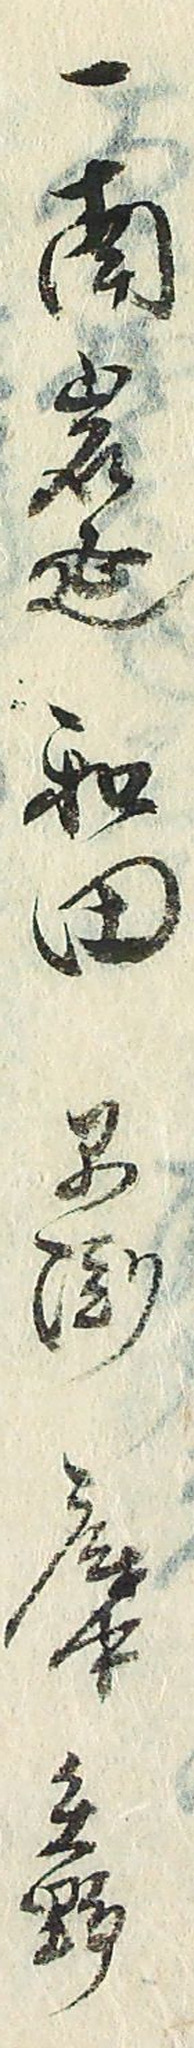一南岩延和田早渕蔵本矢野
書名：諸御趣意書并御下知向之写
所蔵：鳴門教育大学 Naruto University of Education
